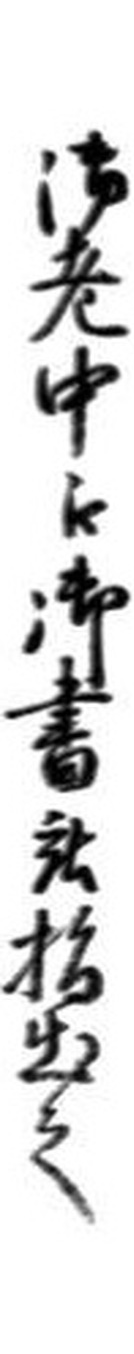御老中江御書被指出之
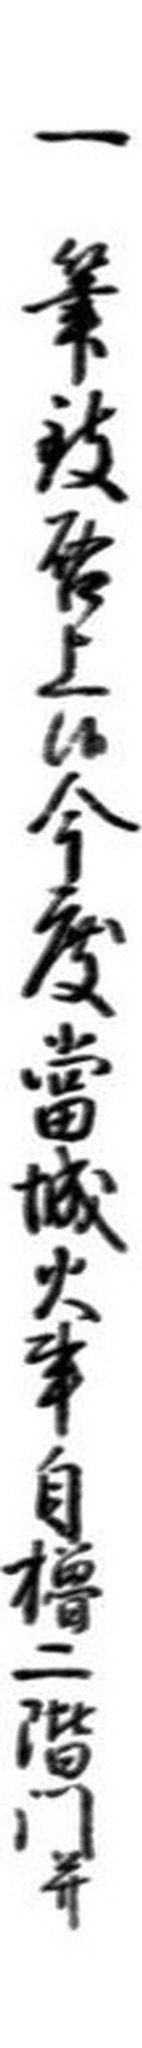一筆致啓上候今度当城火事自櫓二階門并
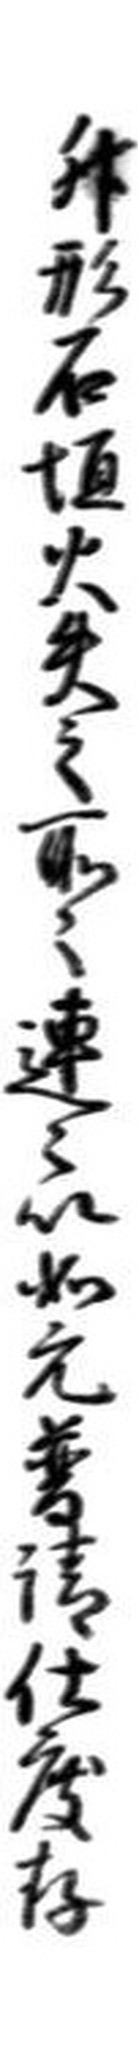升形石垣火失之所々連々以如元普請仕度存
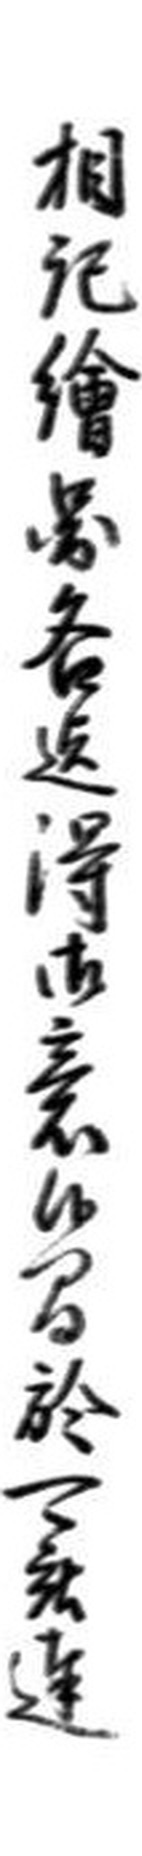相記絵図各迄得御意候間於可被達
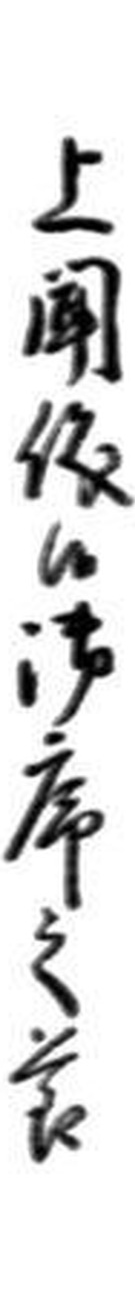上聞儀候御序之節
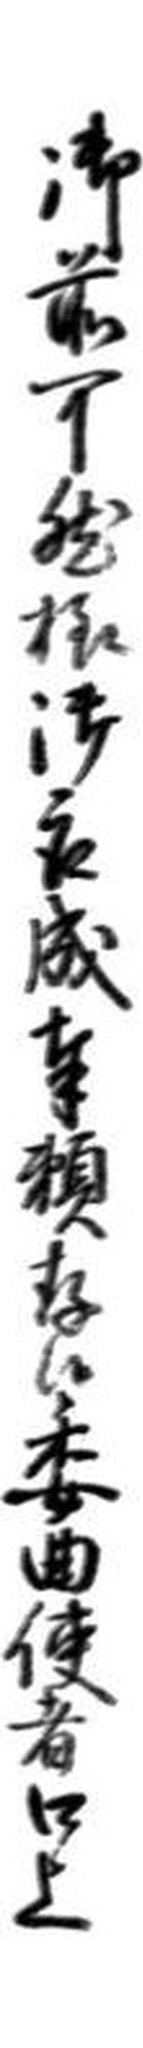御前可然様御取成奉頼存候委曲使者口上

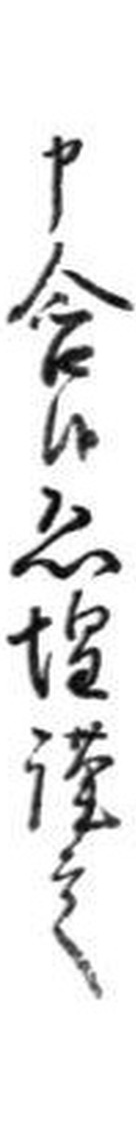申含候恐惶謹言
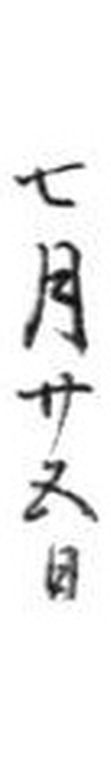七月廿五日
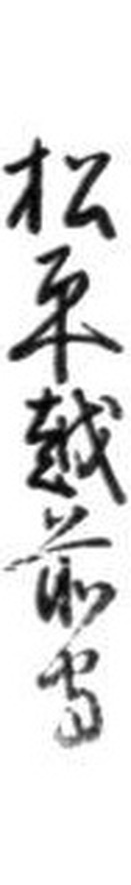松平越前守
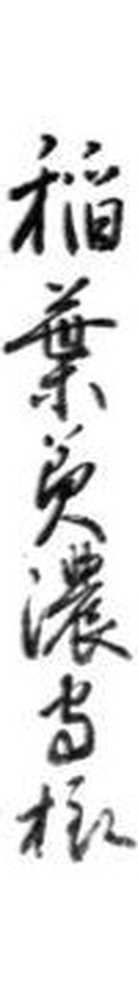稲葉美濃守様
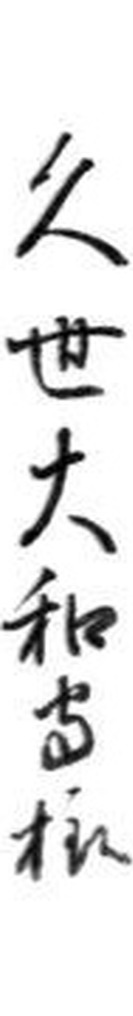久世大和守様
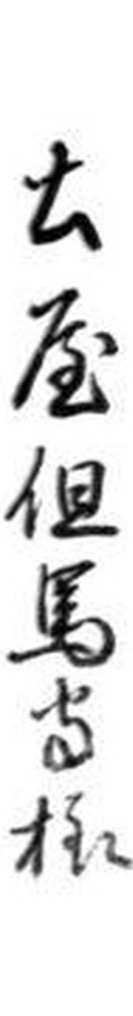土屋但馬守様
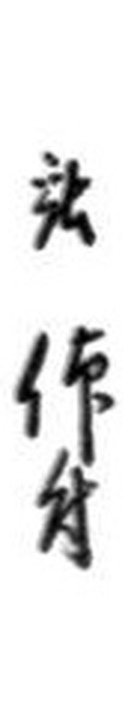被仰付
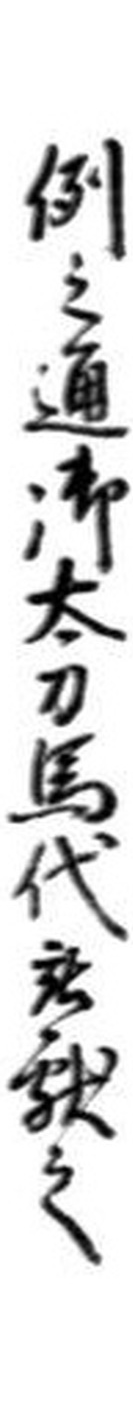例之通御太刀馬代被献之
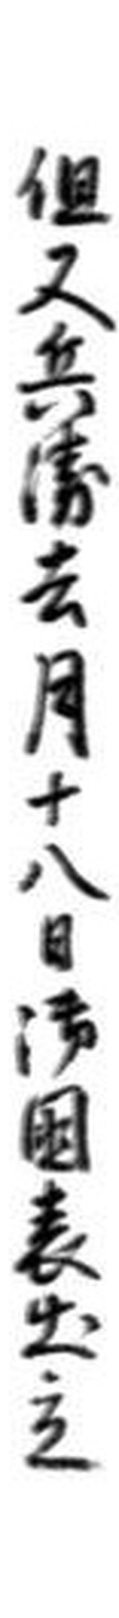但又兵衛去月十八日御国表出立
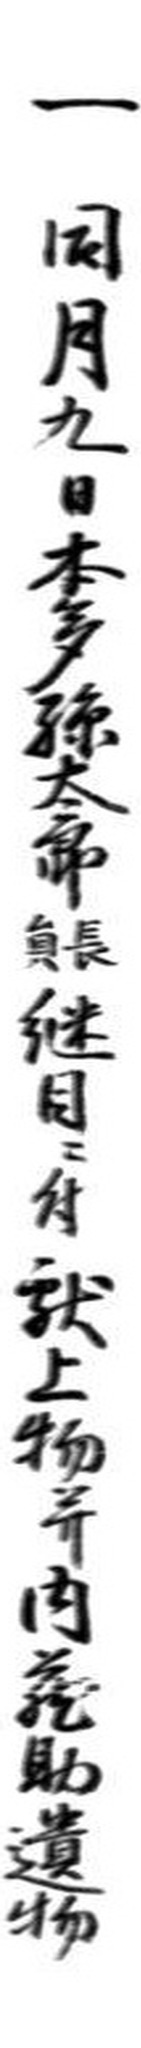一同月九日本多孫太郎長員継目ニ付献上物并内蔵助遺物
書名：家譜 七 光通公 従寛文四年到同九年
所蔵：福井県文書館 Fukui Prefectural Archives
